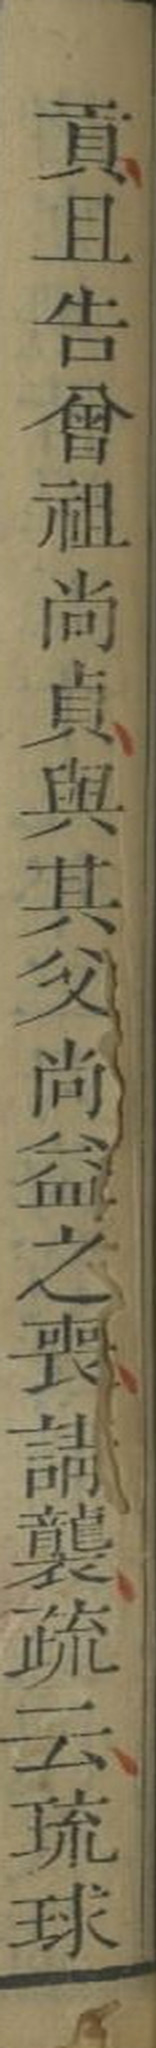貢且告曽祖尚貞与其父尚益之喪請襲疏云琉球
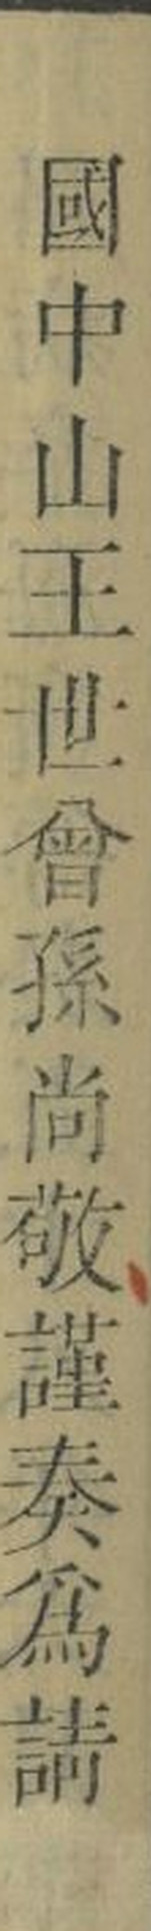国中山王世曽孫尚敬謹奏爲請
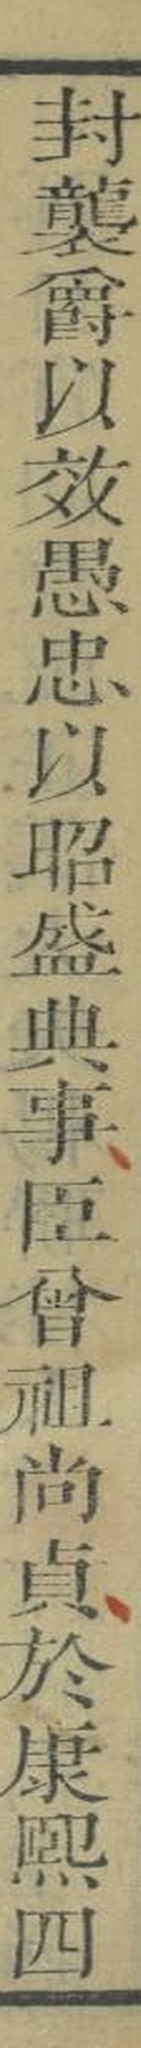封襲爵以效愚忠以昭盛典事臣曽祖尚貞於康煕四
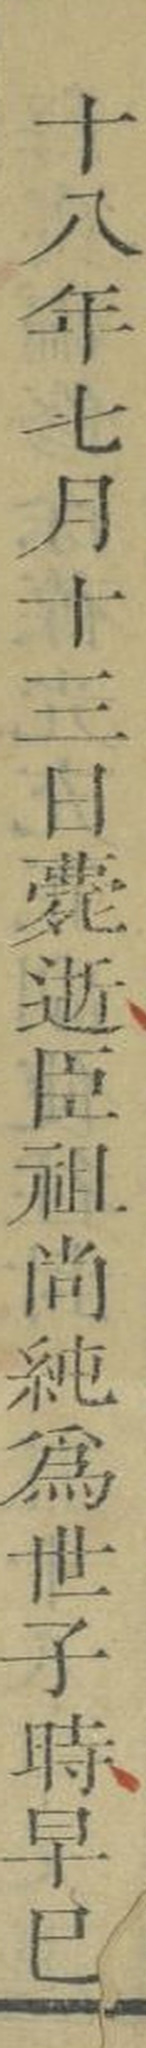十八年七月十三日薨逝臣祖尚純為世子時早巳
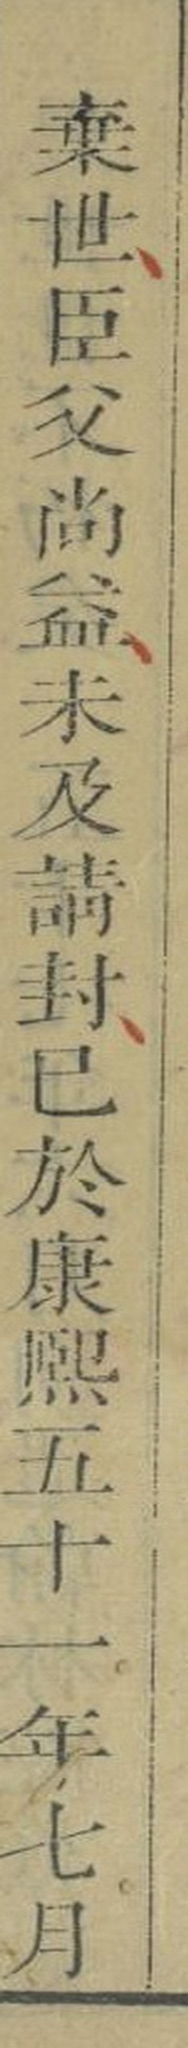棄世臣父尚益未及請封巳於康煕五十一年七月
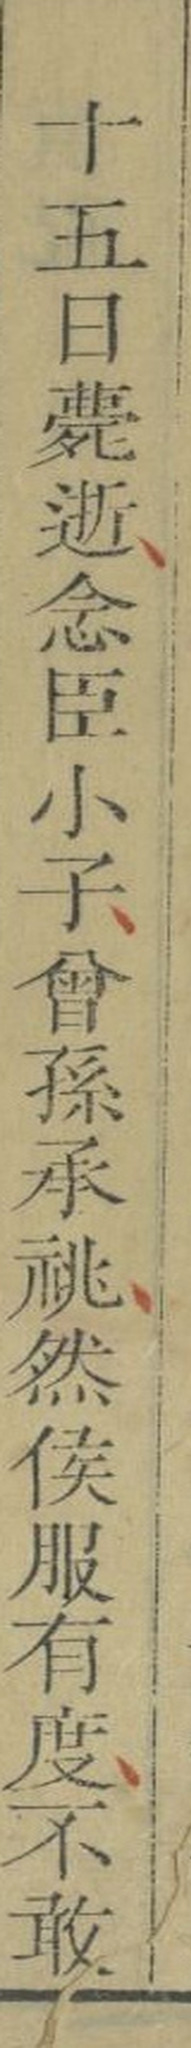十五日薨逝念臣小子曽孫承祧然侯服有度不敢
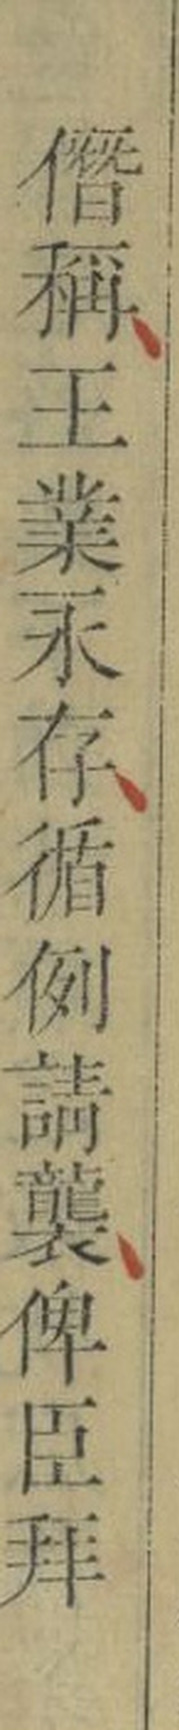僭称王業永存循例請襲俾臣拝
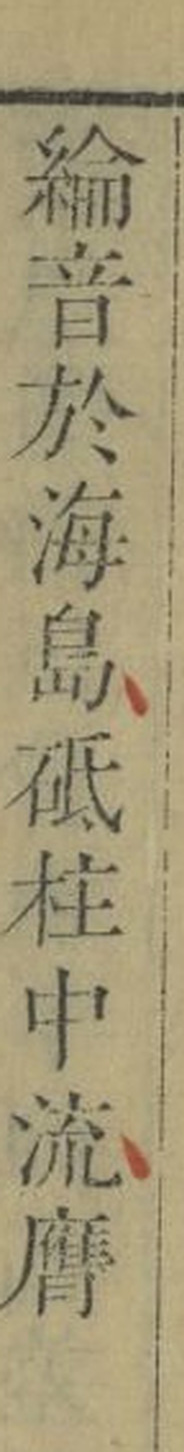綸音於海島砥柱中流膺
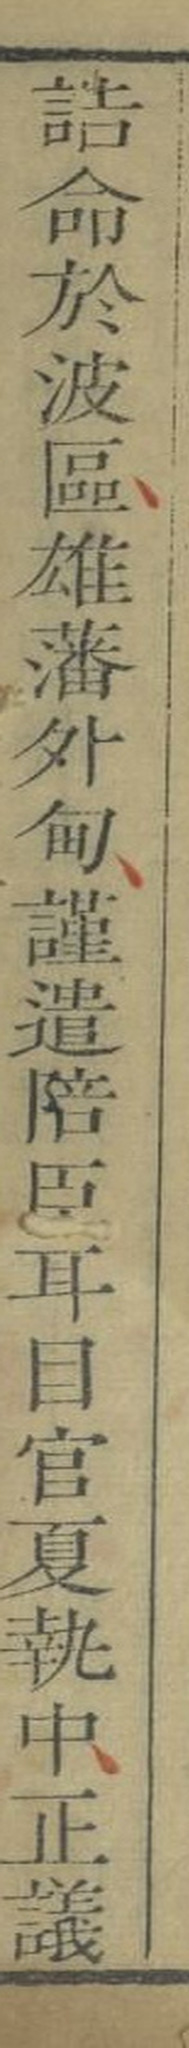誥命於波区雄藩外甸謹遣陪臣耳目官夏執中正議

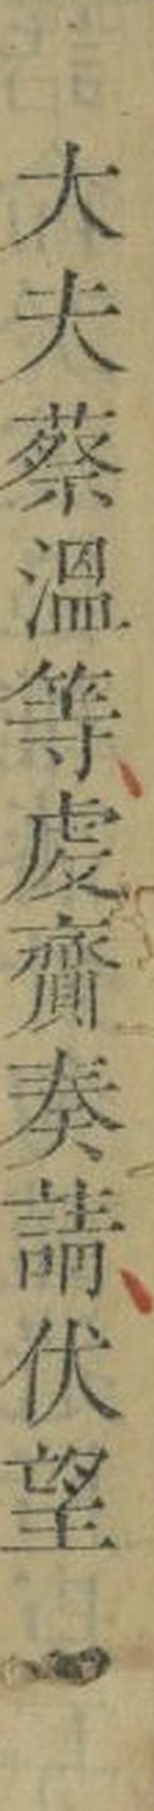大夫蔡温等虔齎奏請伏望
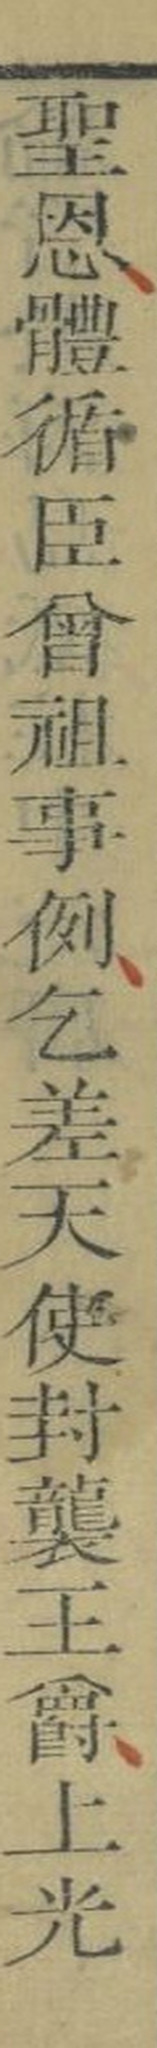聖恩体循臣曽祖事例乞差天使封襲王爵上光
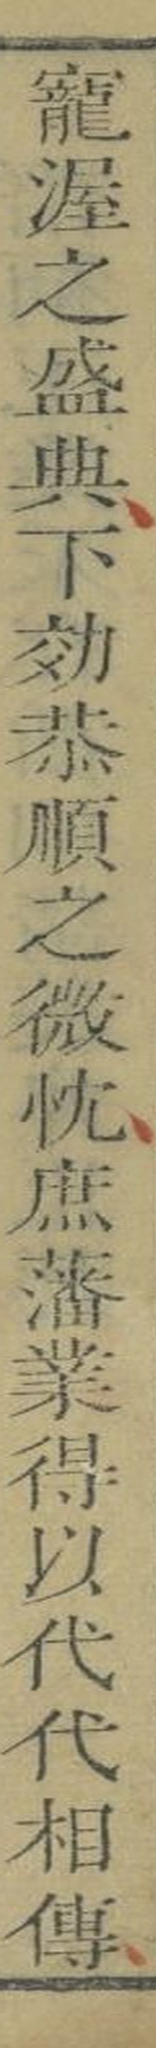寵渥之盛典下効恭順之微忱庶藩業得以代代相伝
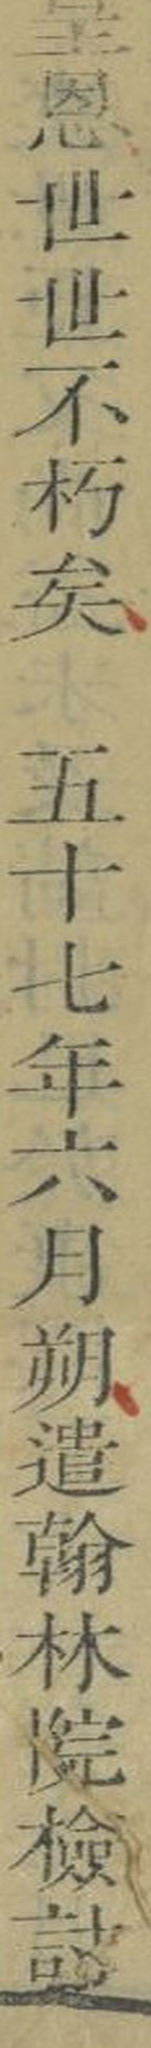皇恩世世不朽矣五十七年六月朔遣翰林院検討
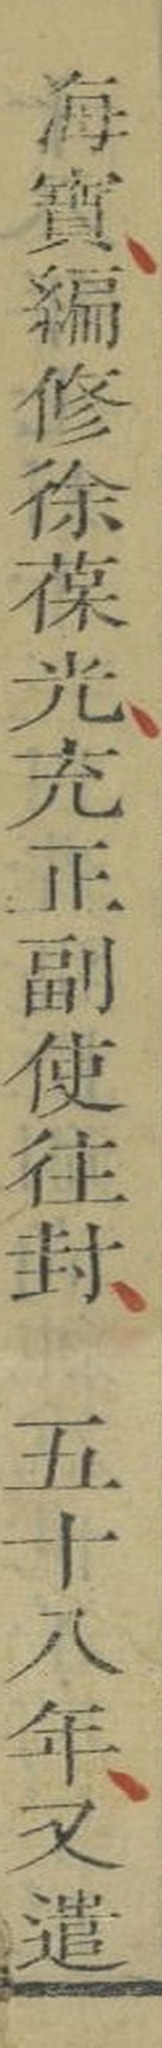海宝編修徐葆光充正副使往封五十八年又遣
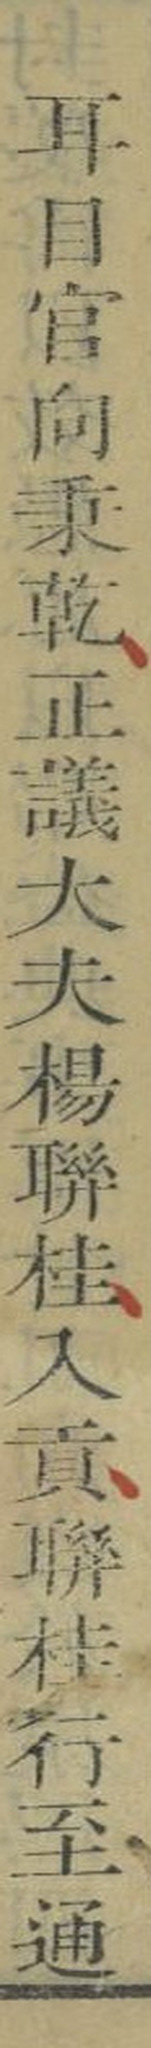耳目官向秉乾正議大夫楊聯桂入貢聯桂行至通
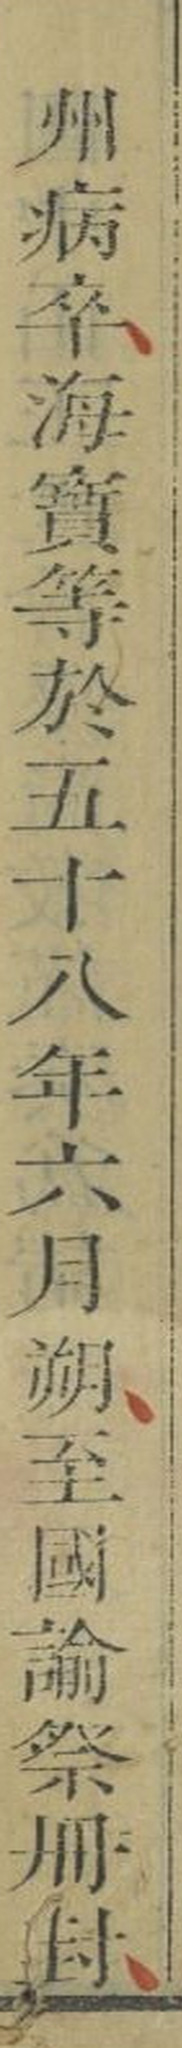州病卒海宝等於五十八年六月朔至国諭祭冊封
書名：中山伝信録 巻三
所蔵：University of the Ryukyus Library
